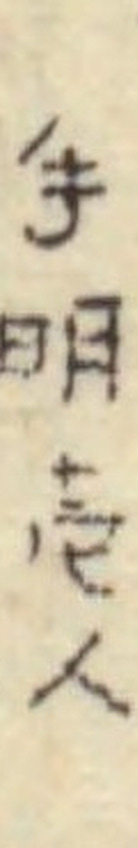手明壱人
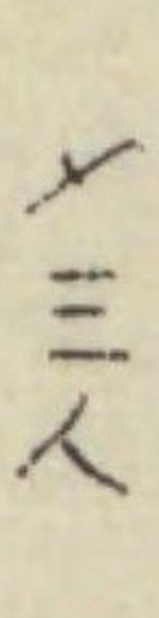〆六人
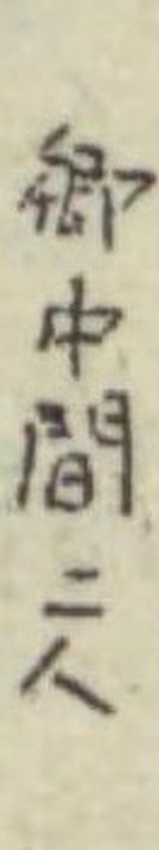御中間二人
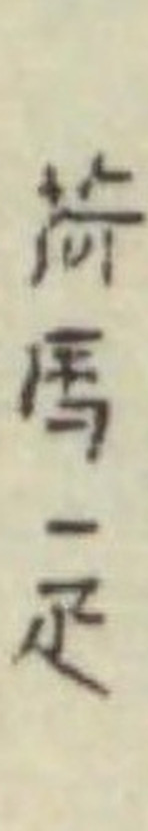小荷駄一疋
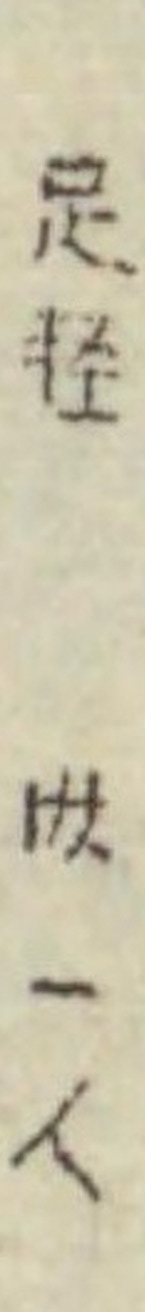足軽二人
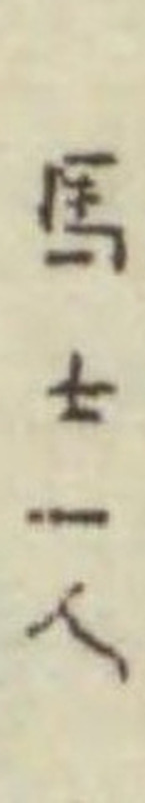馬士一人
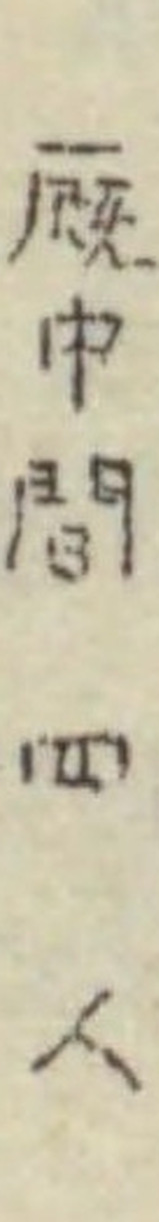厩中間一人
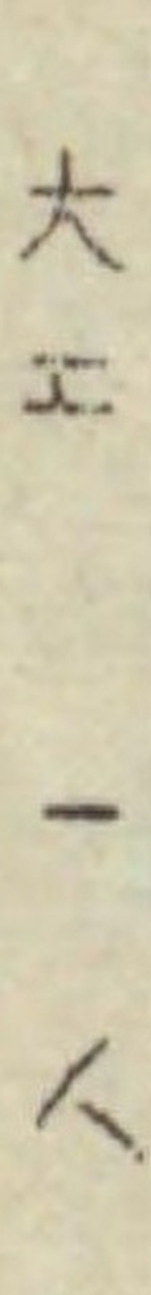大工一人
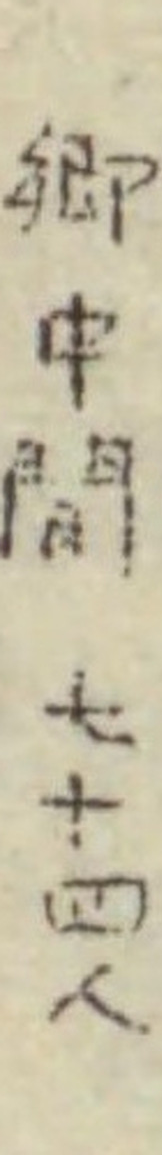御中間七十四人
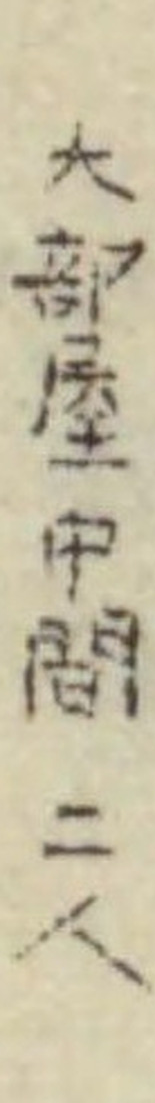大部屋中間二人
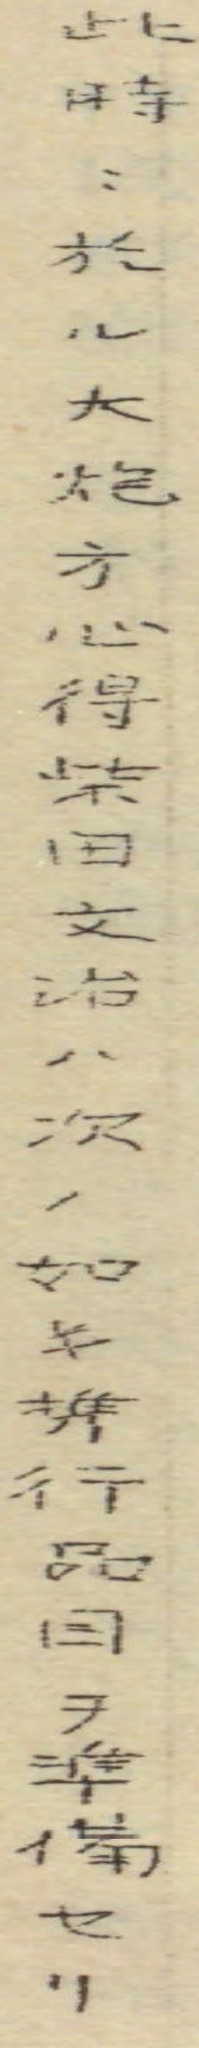此時二於る大炮方心得柴田文治ハ次ノ如キ携行品目ヲ準備セリ

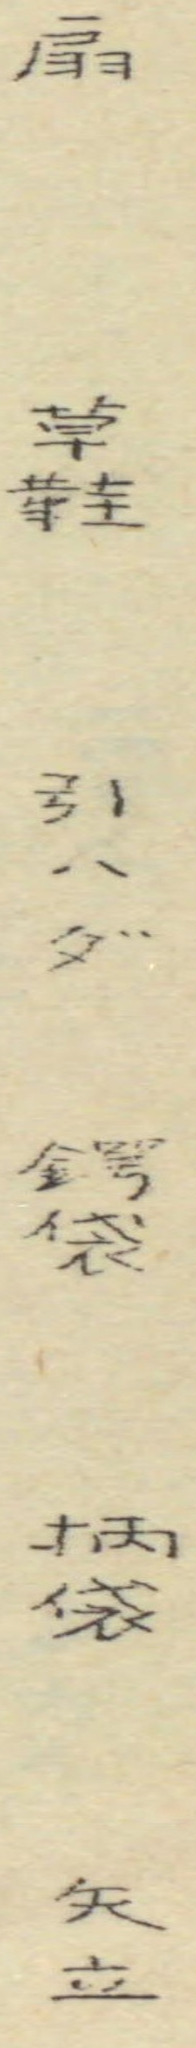扇草鞋引ハダ鍔袋柄袋矢立
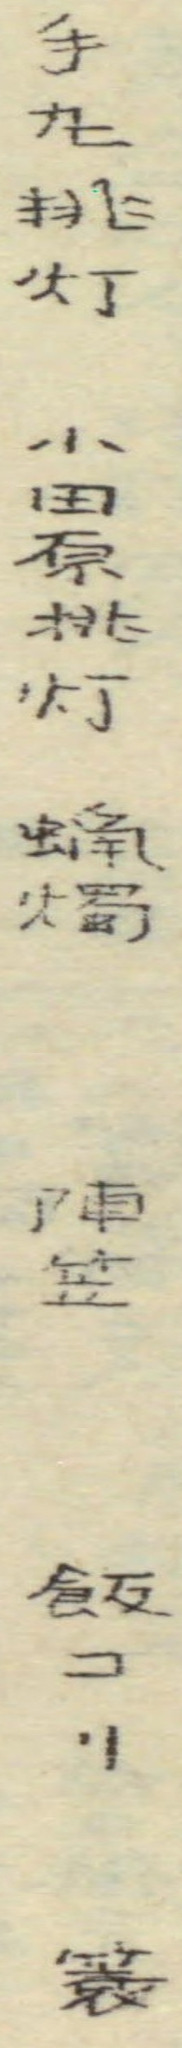手丸挑灯小田原挑灯蝋燭陣笠飯コリ蓑
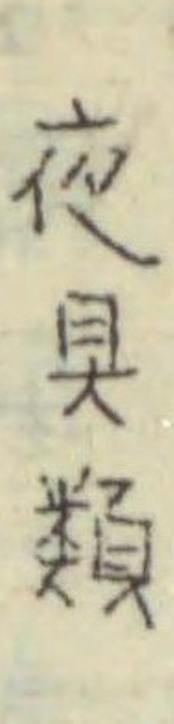夜具類
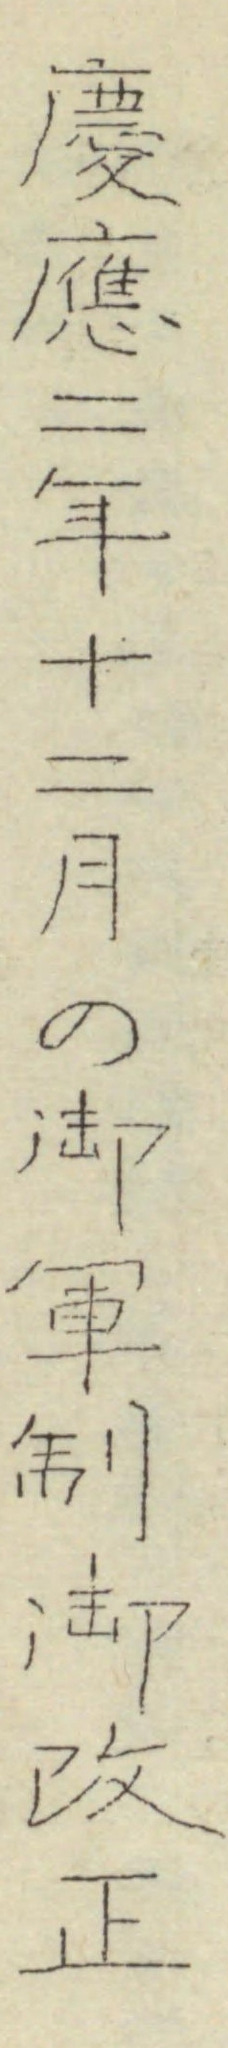慶応二年十二月の御軍制御改正

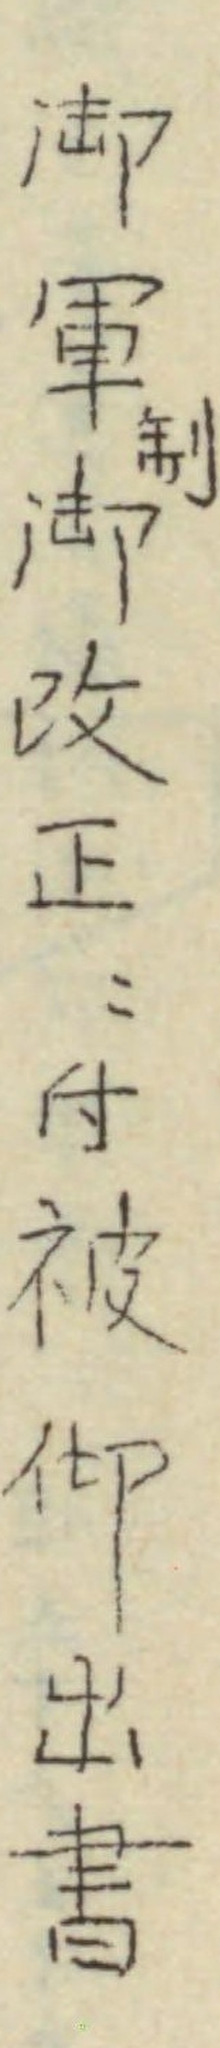御軍制御改正二付被仰出書
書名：三河吉田藩動員史料
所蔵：国立国会図書館 National Diet Library, JAPAN
